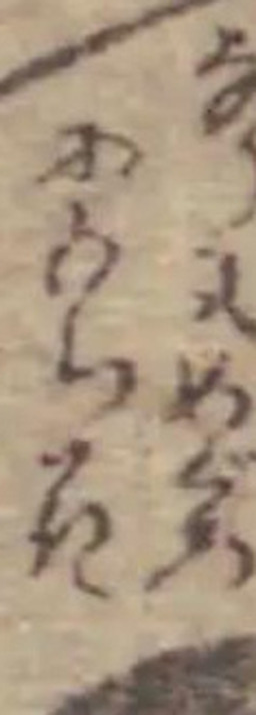にもちつき

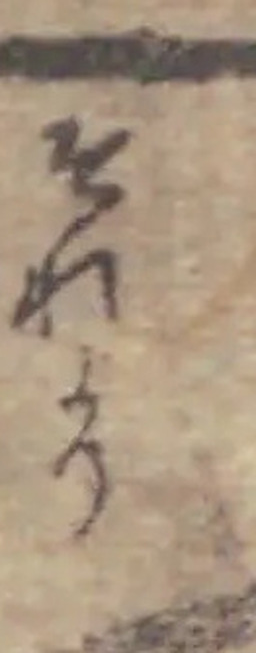それより
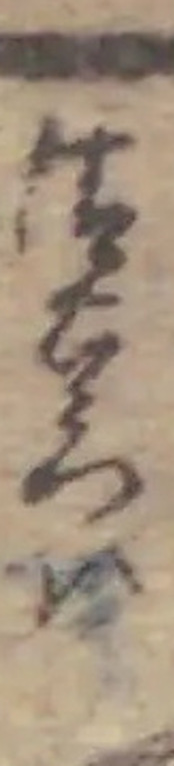清右エ門は
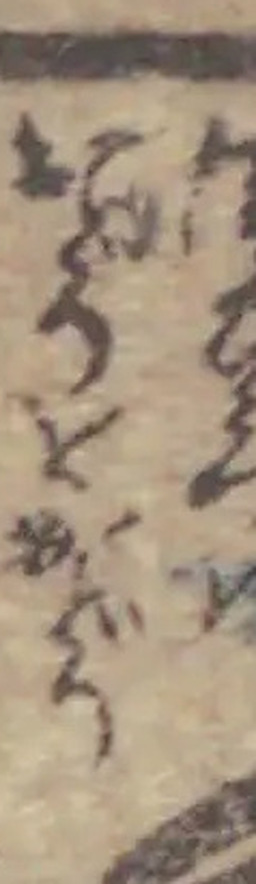おどりをおどり
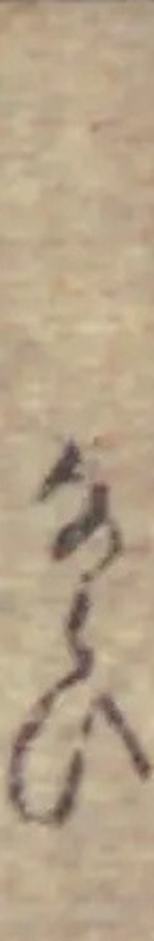ならひ
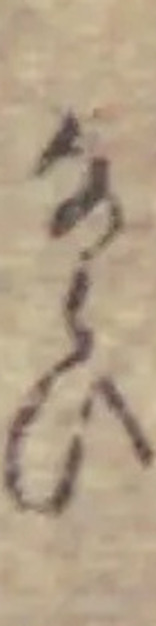ならひ
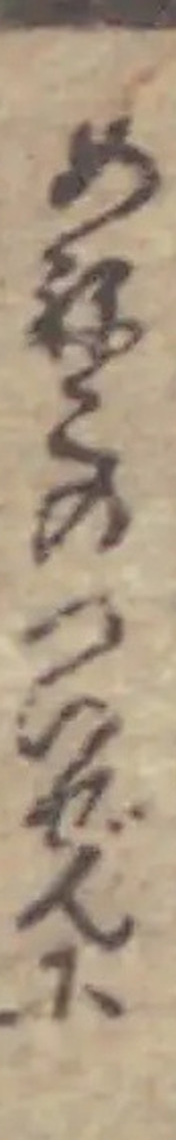めねこのついぜんに
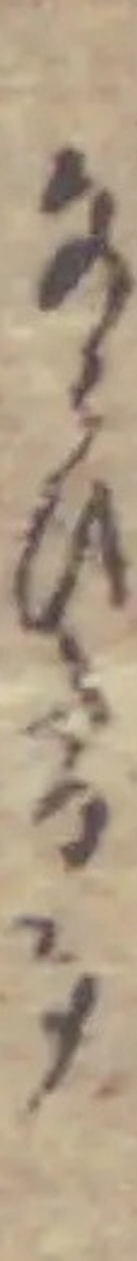ならひたる事
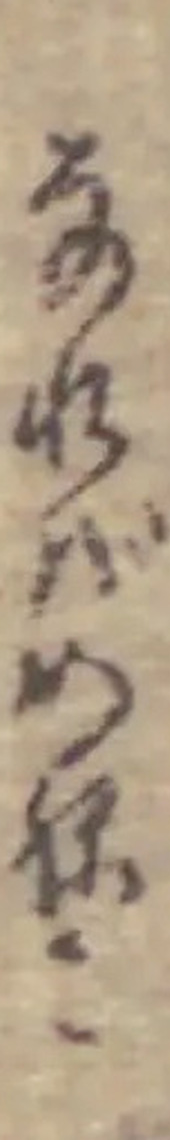なればめねこ
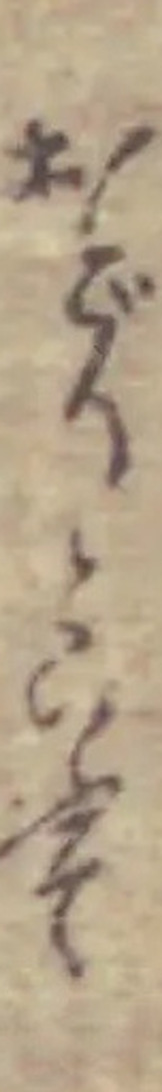おどりといつて
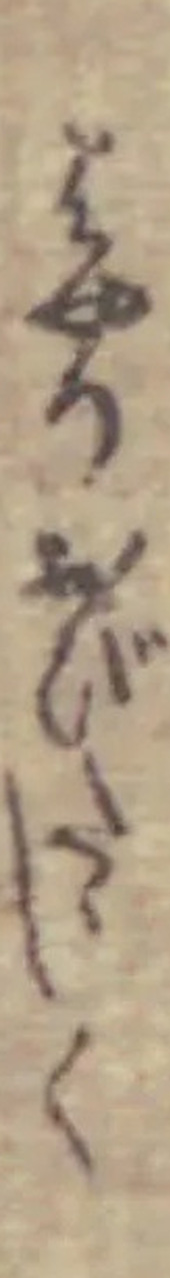はやりおびたゝしく
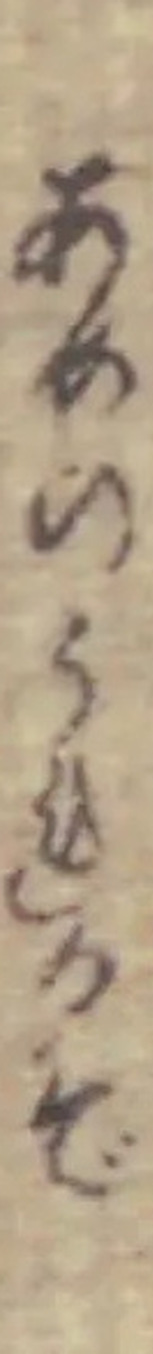あめのうれるぞ
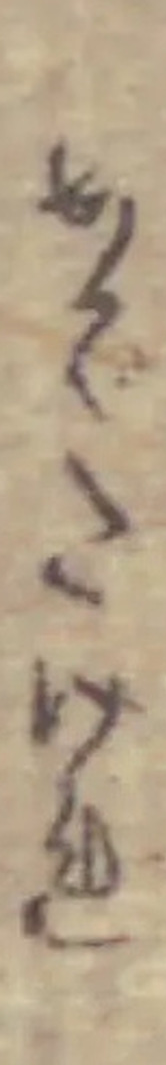めでたけれ
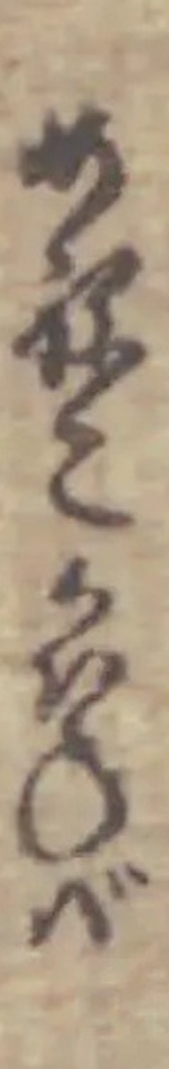めねこかはねば
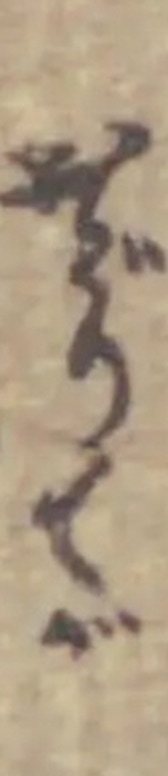おどりてが
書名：冷水灰毛猫 2巻
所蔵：国立国会図書館 National Diet Library, JAPAN
